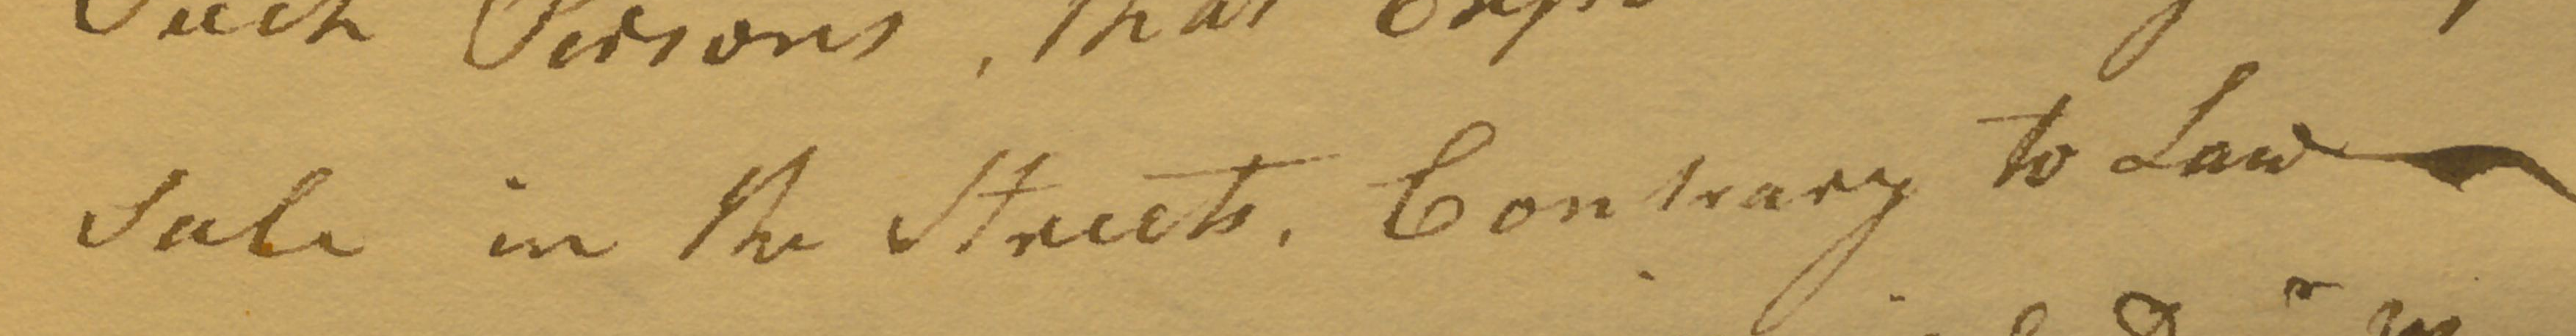Sale in the Streets. Contrary to Law
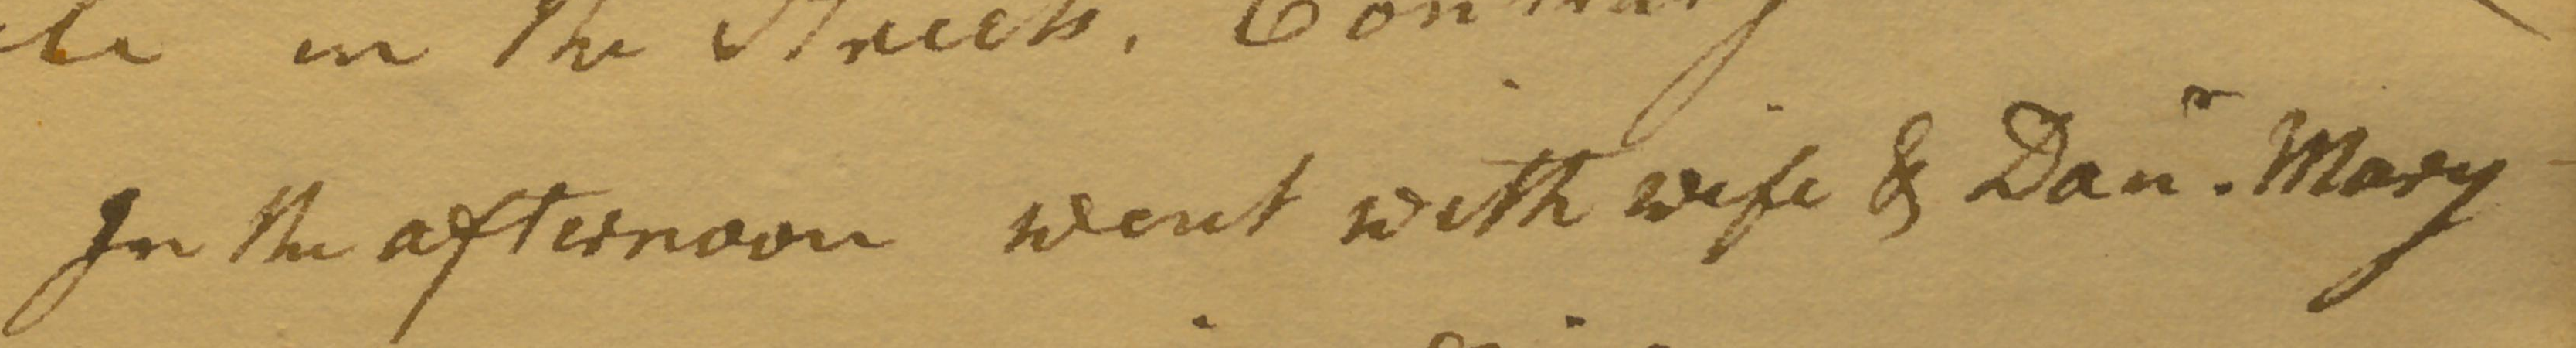In the afternoon went with wife & Dau^r. Mary
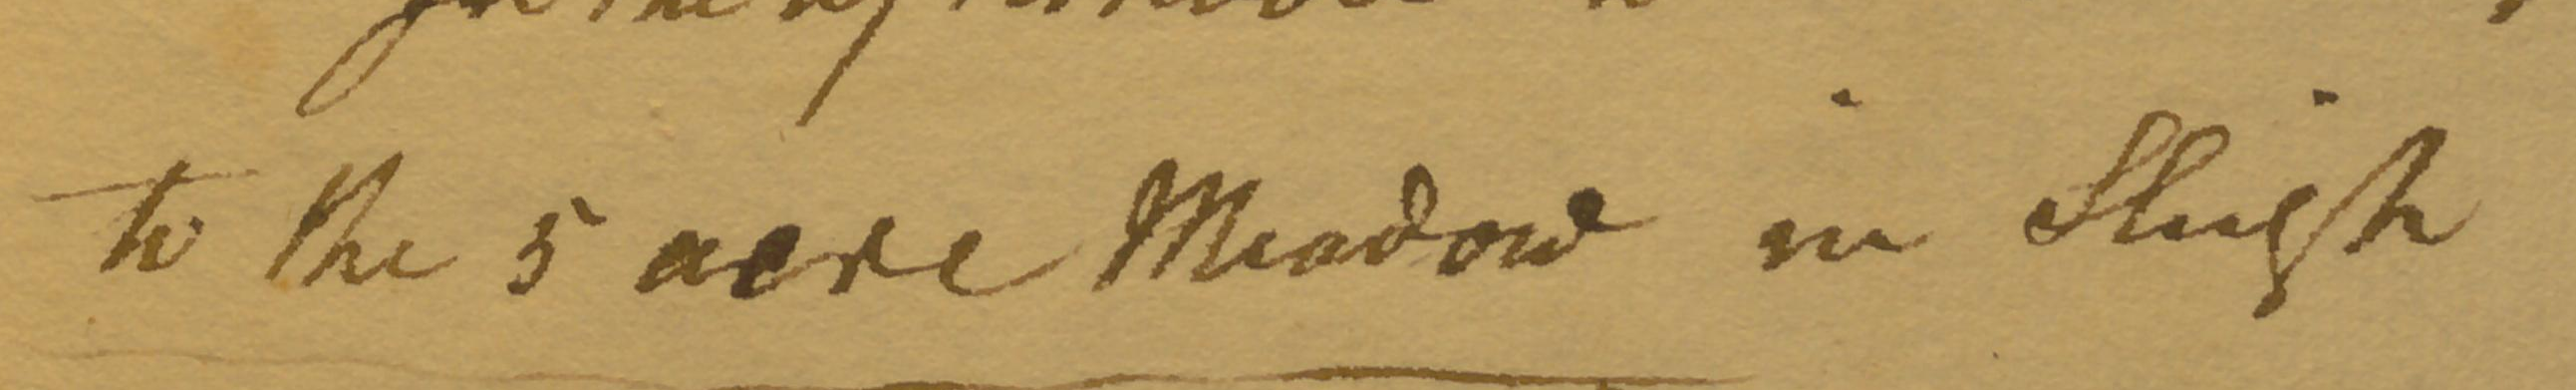to the 5 acre Meadow in Sleigh
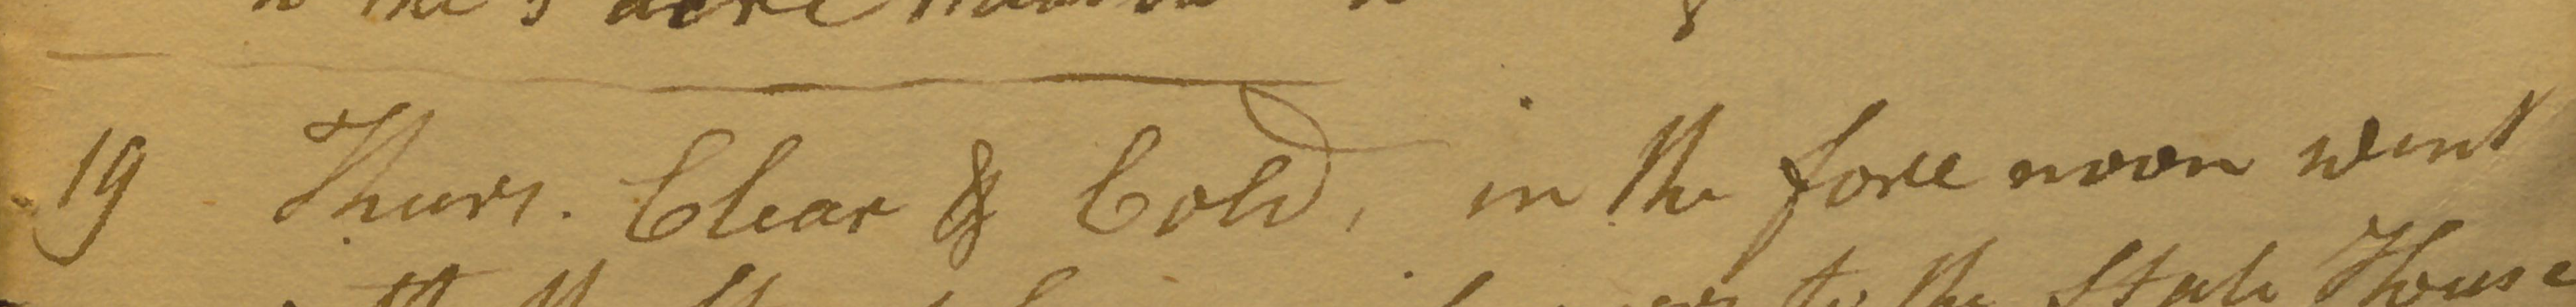19 Thurs. Clear & Cold, in the forenoon went
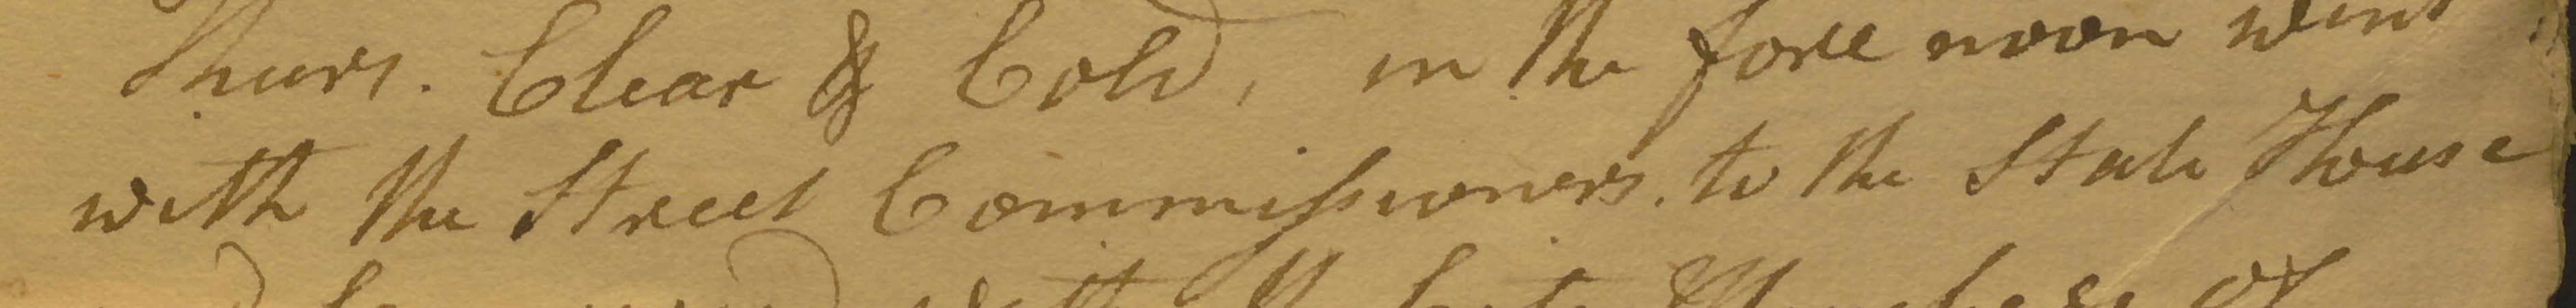with the Street Commissioners. to the State House
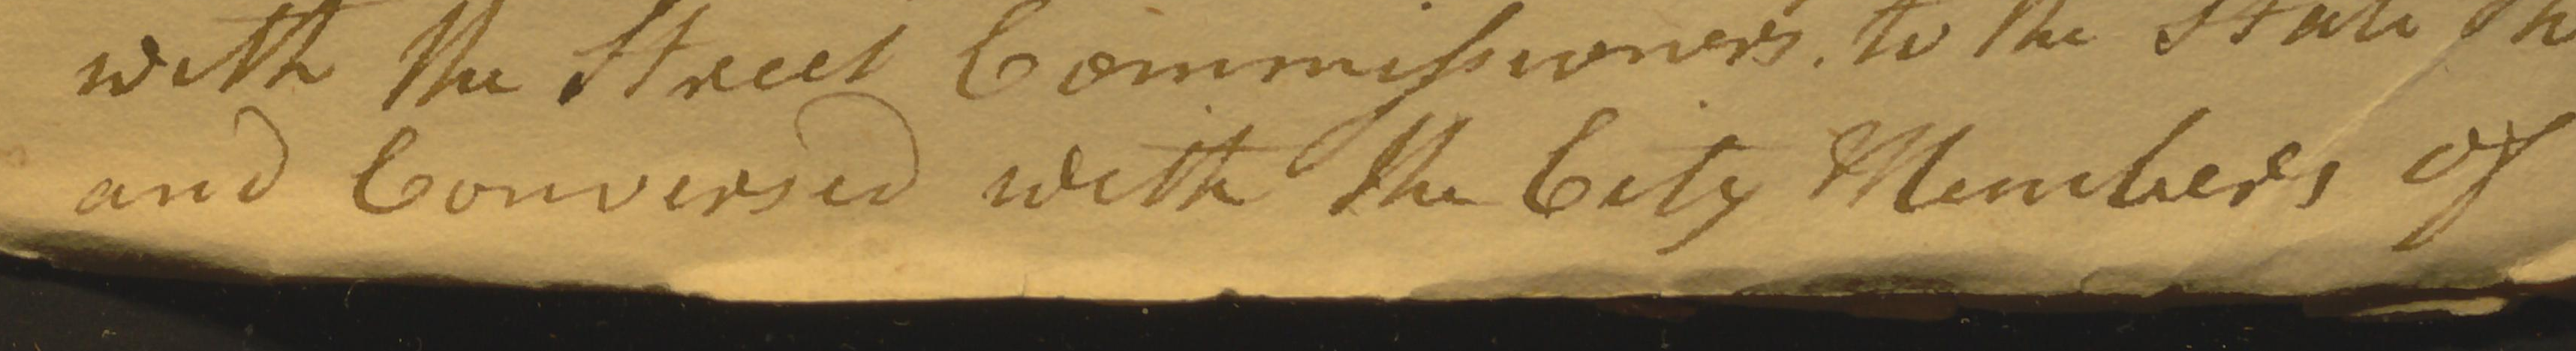and Conversed with the City Members of
